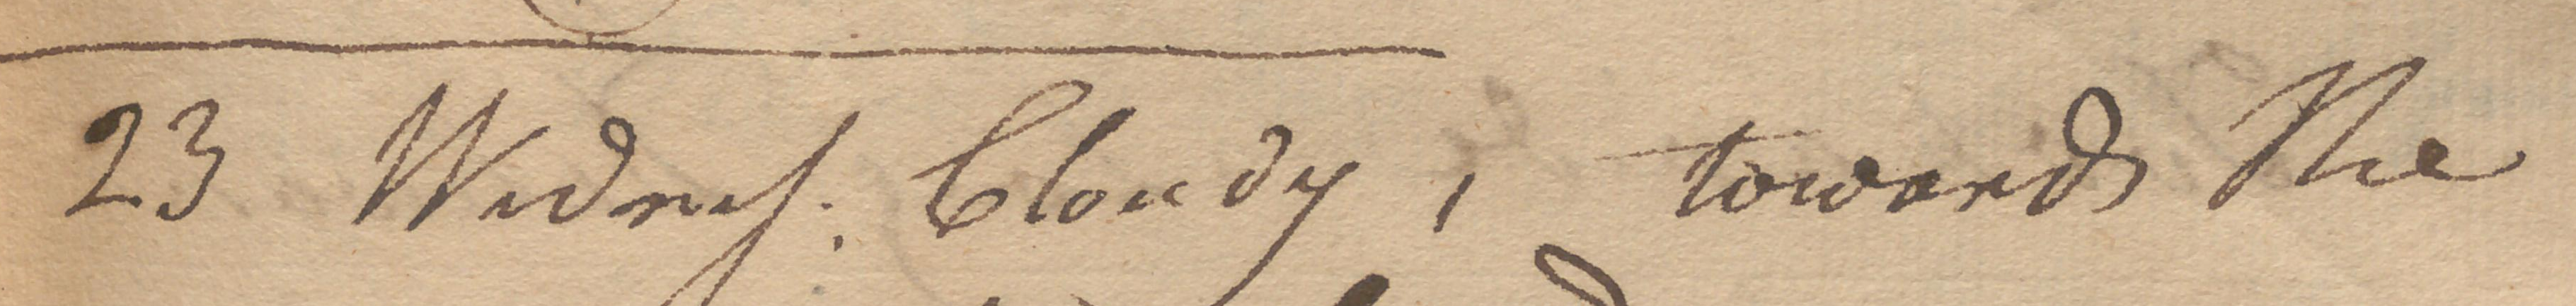23^d Wednes. Cloudy, towands the
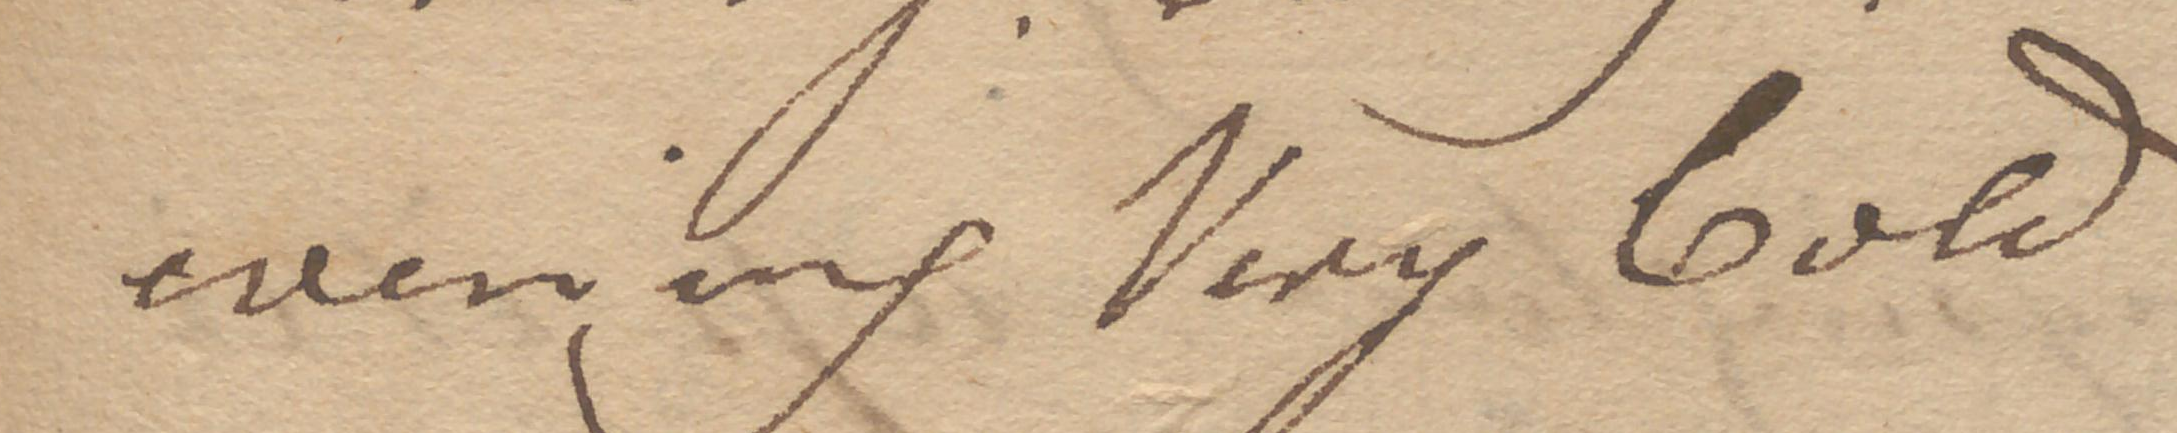evening Very Cold
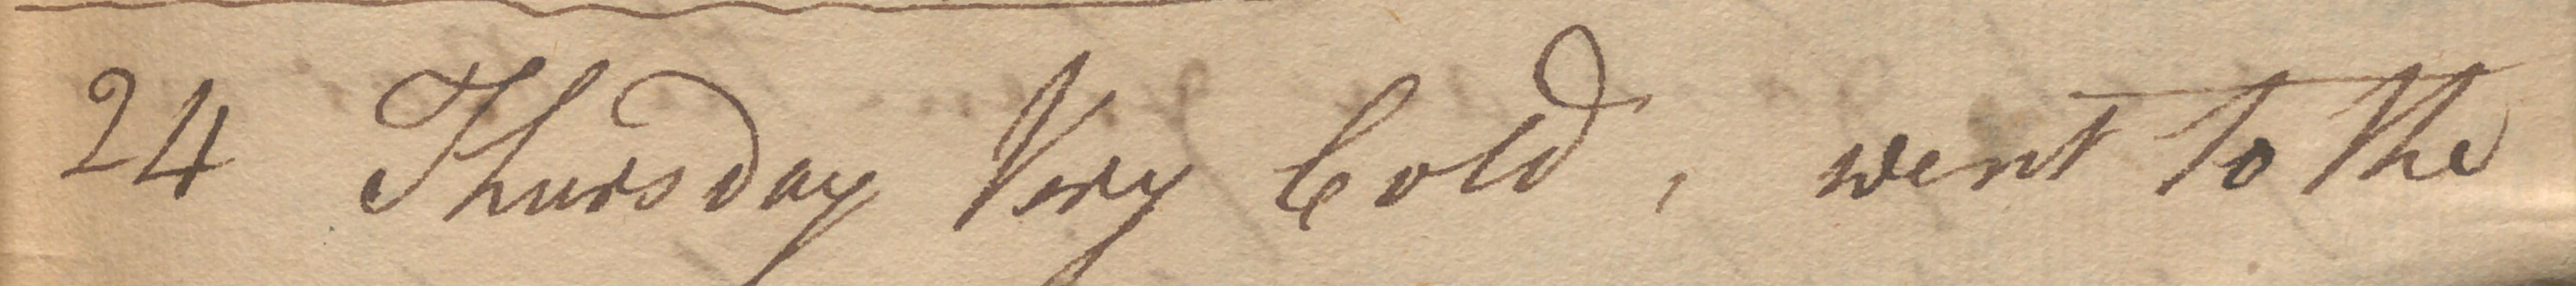24 Thursday Very Cold, went to the
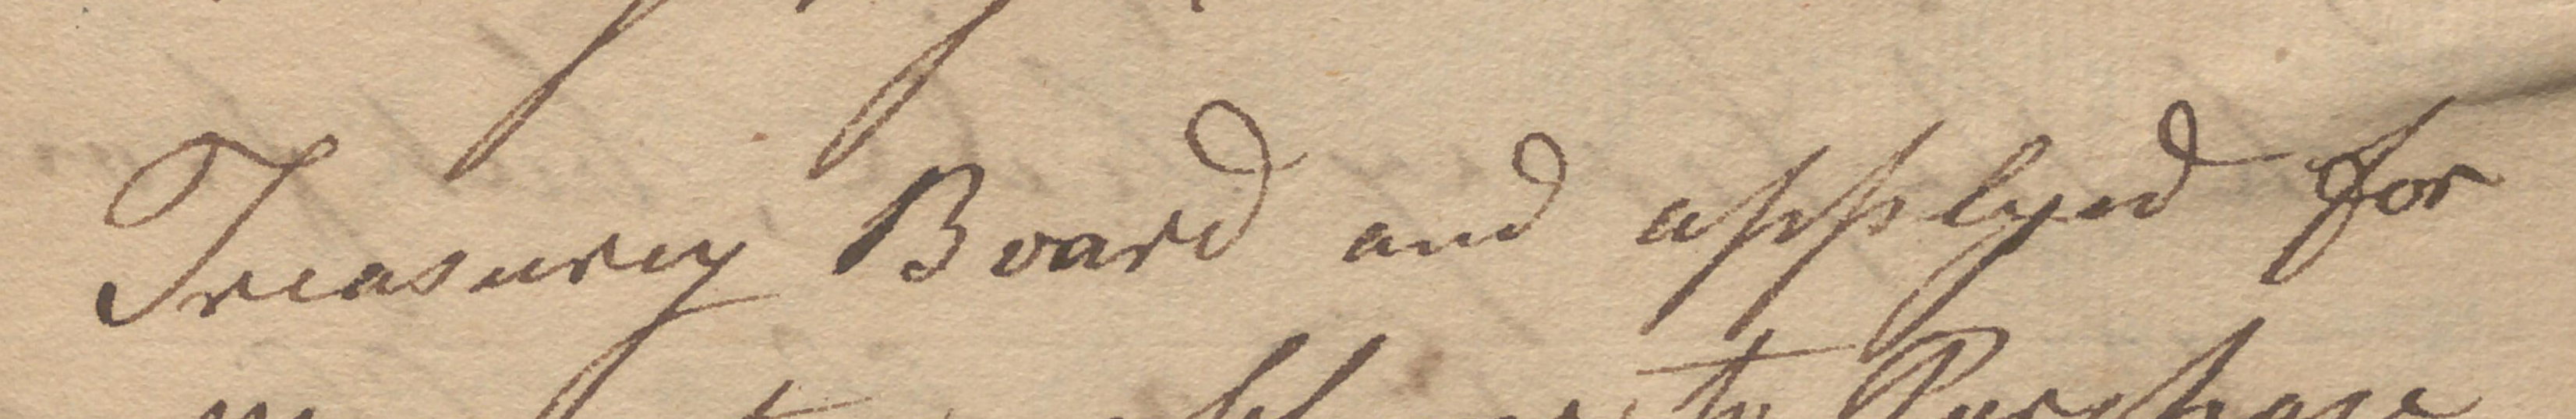Treasurey Board and applyed for
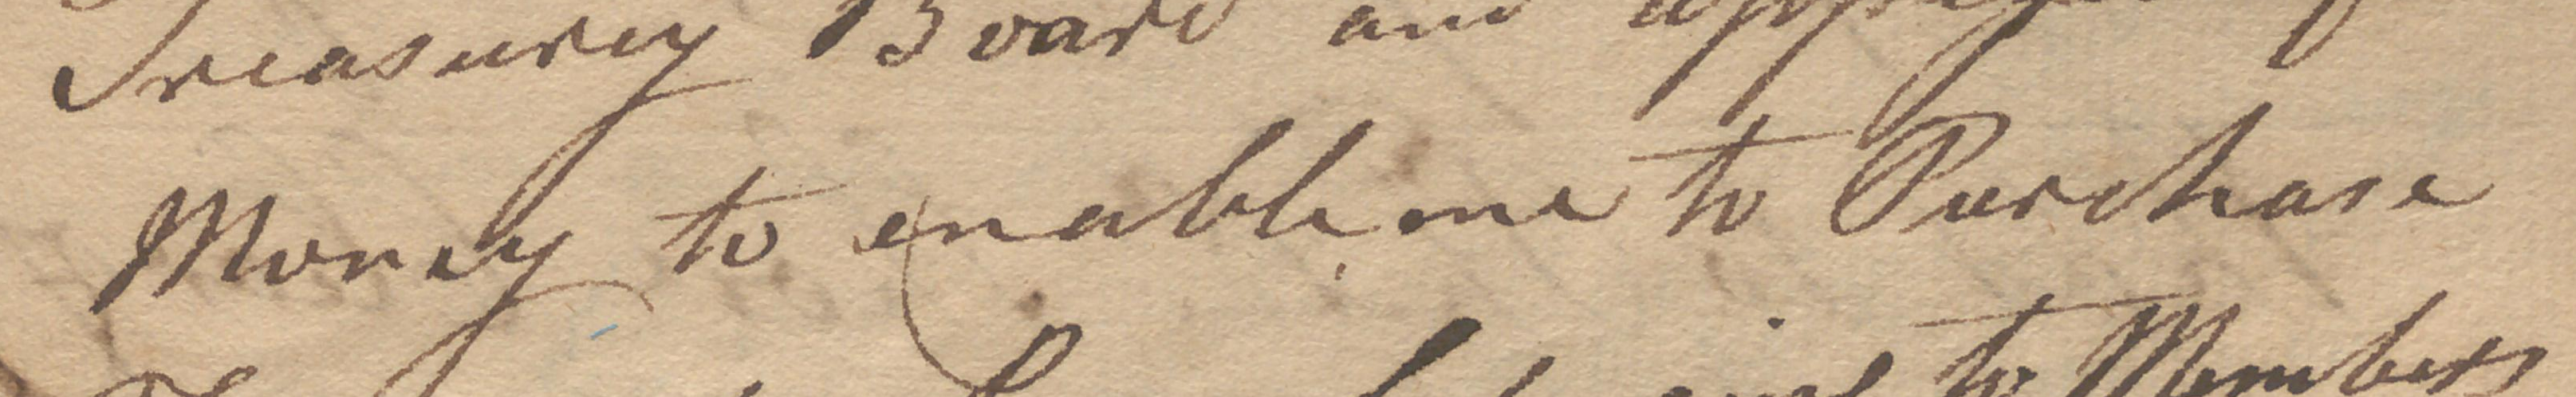Money to enable me to Purchase
